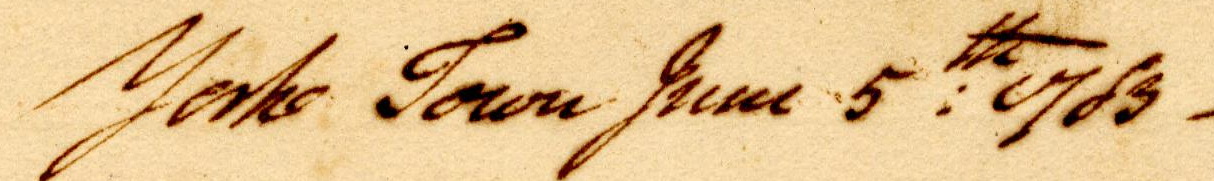Yorke Town June 5^th. 1783
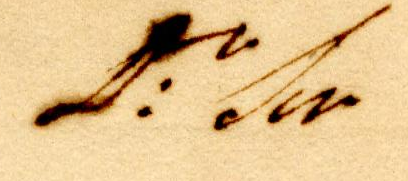D^r. Sir
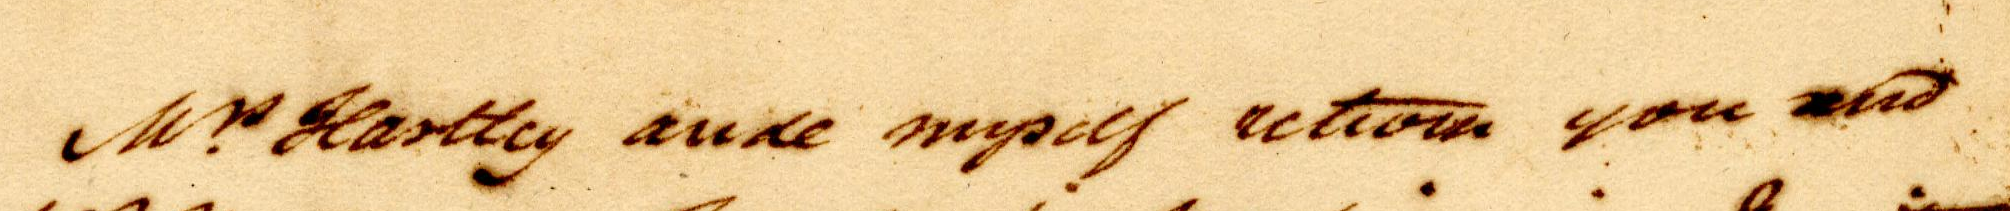M^rs. Hartley ande myself return you and
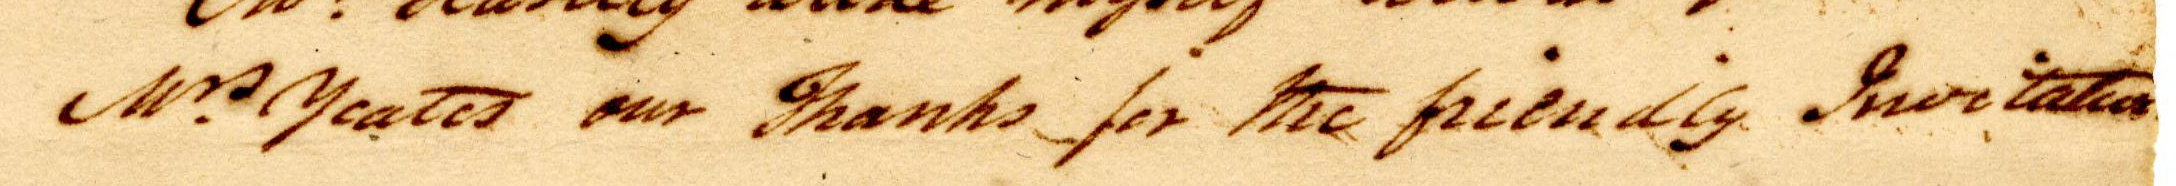M^rs. Yeates our Thanks for the friendly Invitation
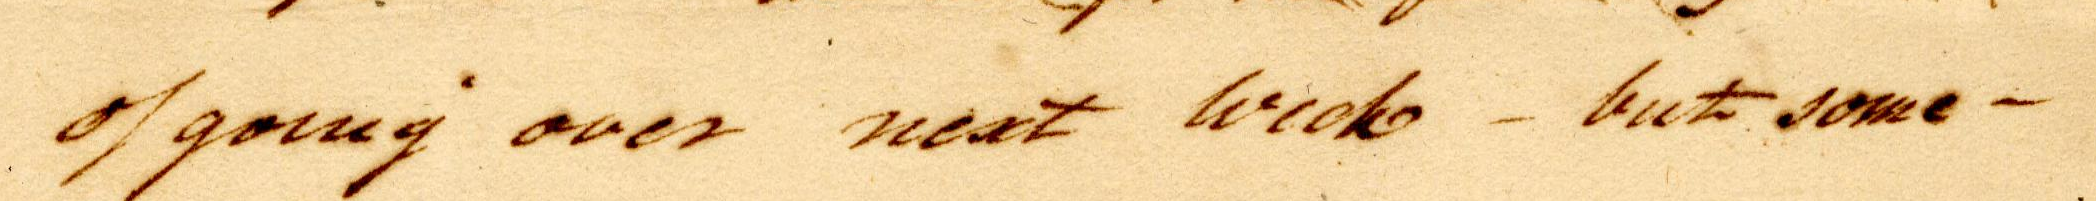of going over next week- but some-
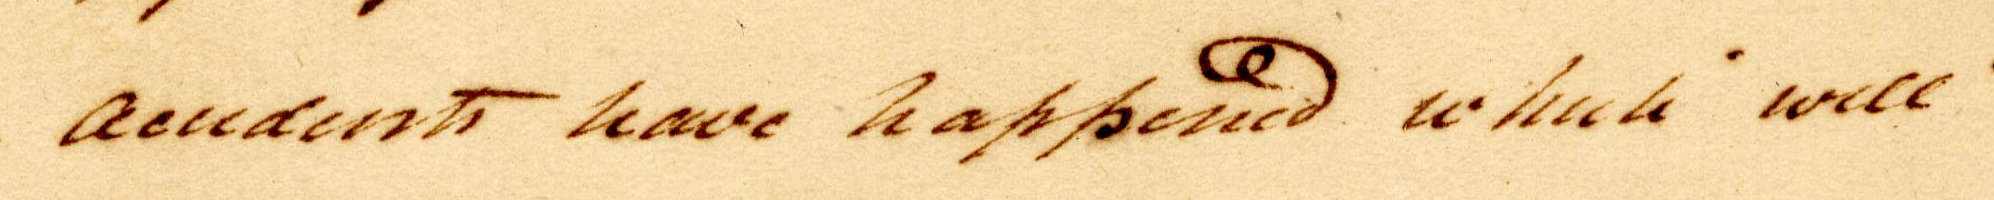Accidents have happened which will
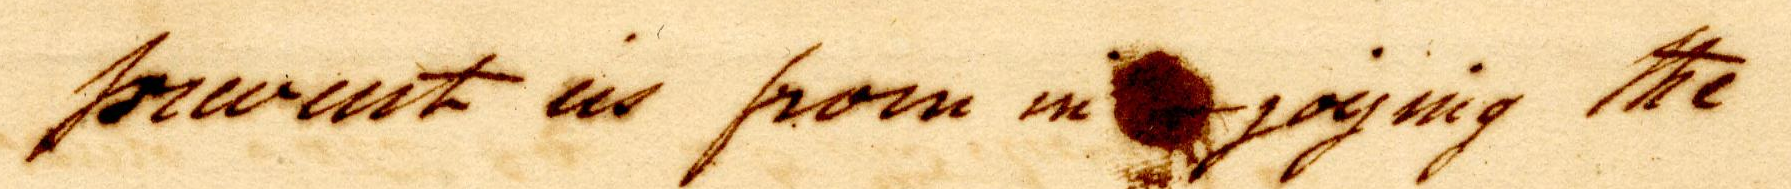prevent us from in -joying the
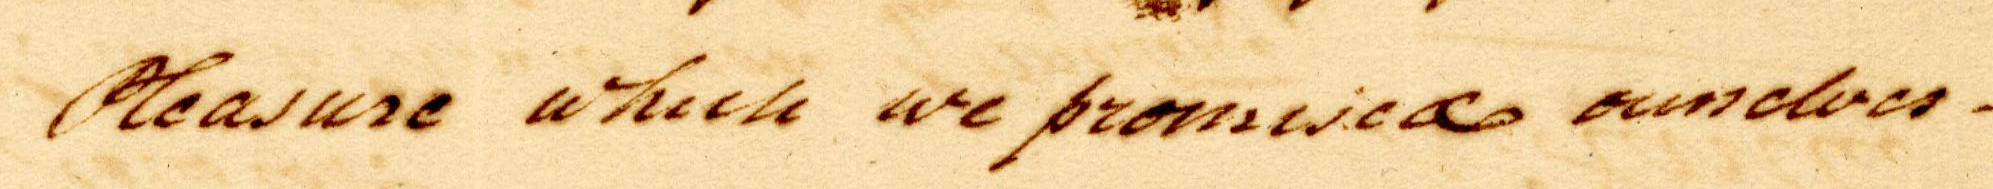Pleasure which we promised ourselves
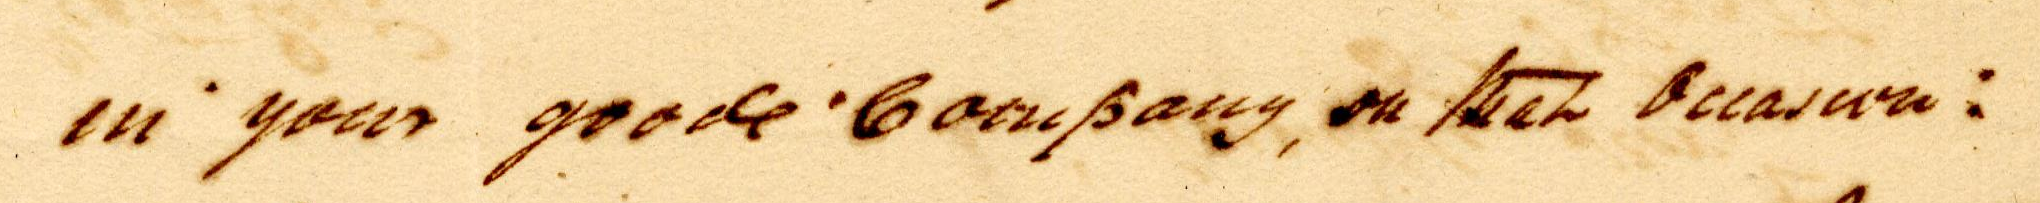in your goode Company on that Occasion:
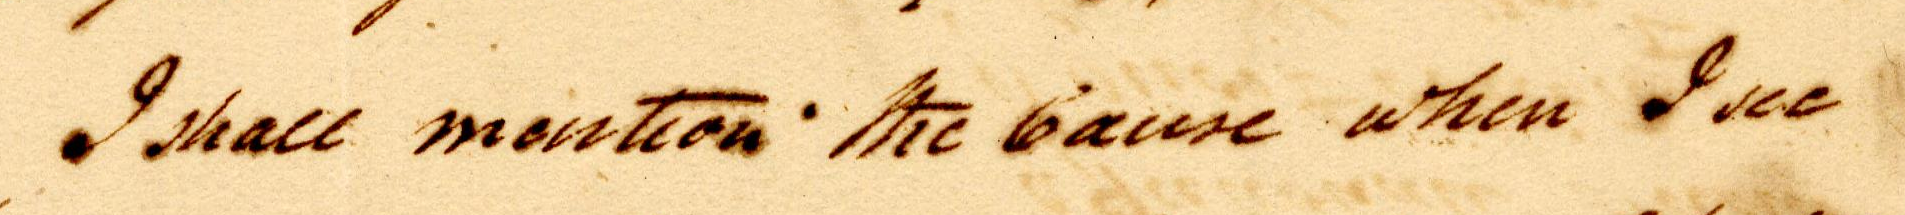I shall motion the Cause when I see
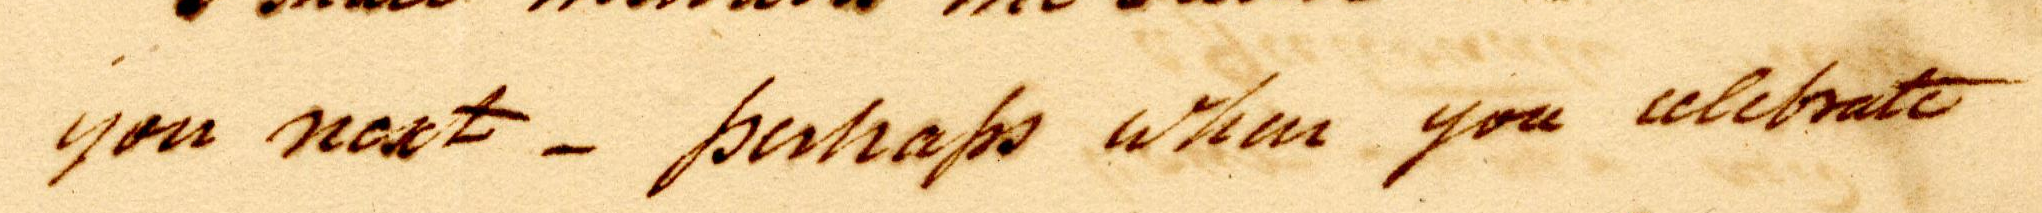you next- perhaps when you celebrate
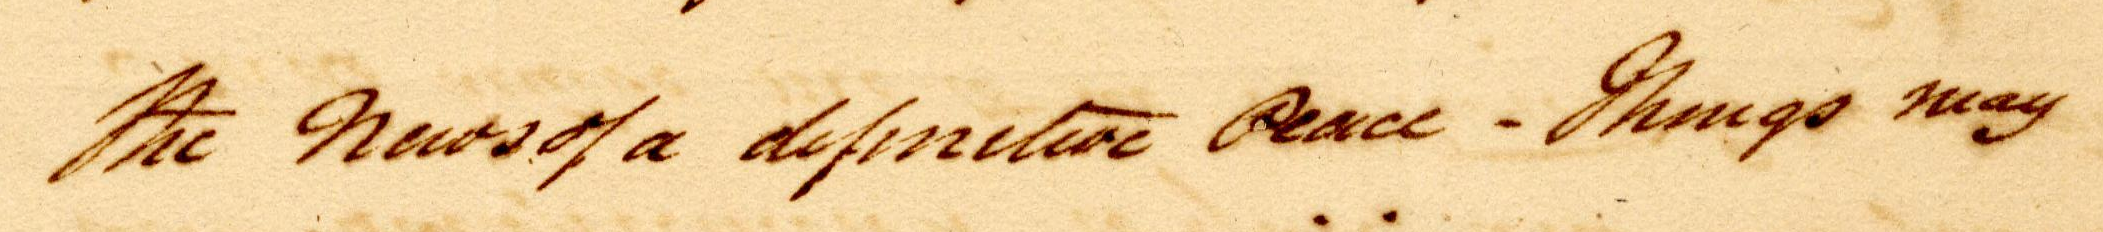the News of a defensive Peace. Things may
